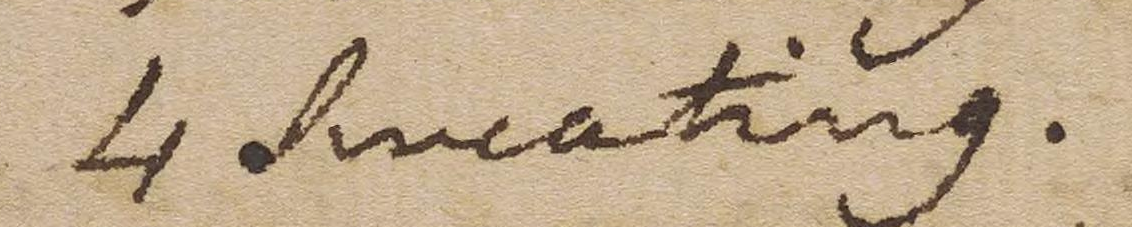4 Sweating.
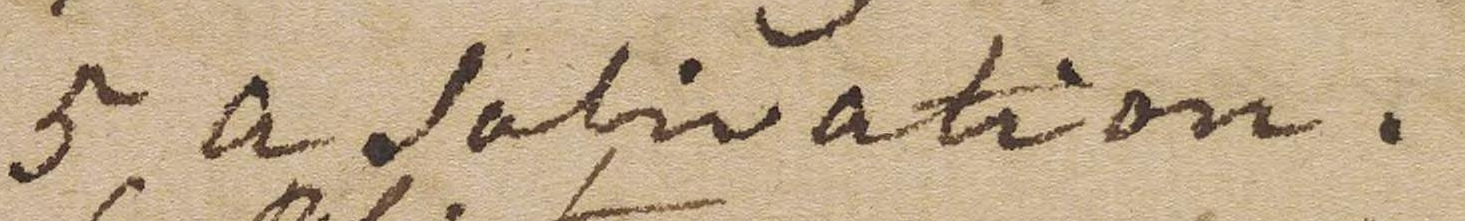5 A Salination.
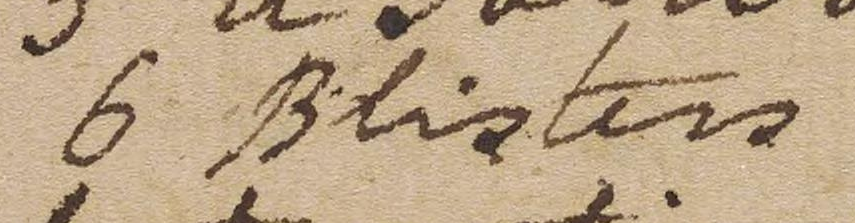6 Blisters
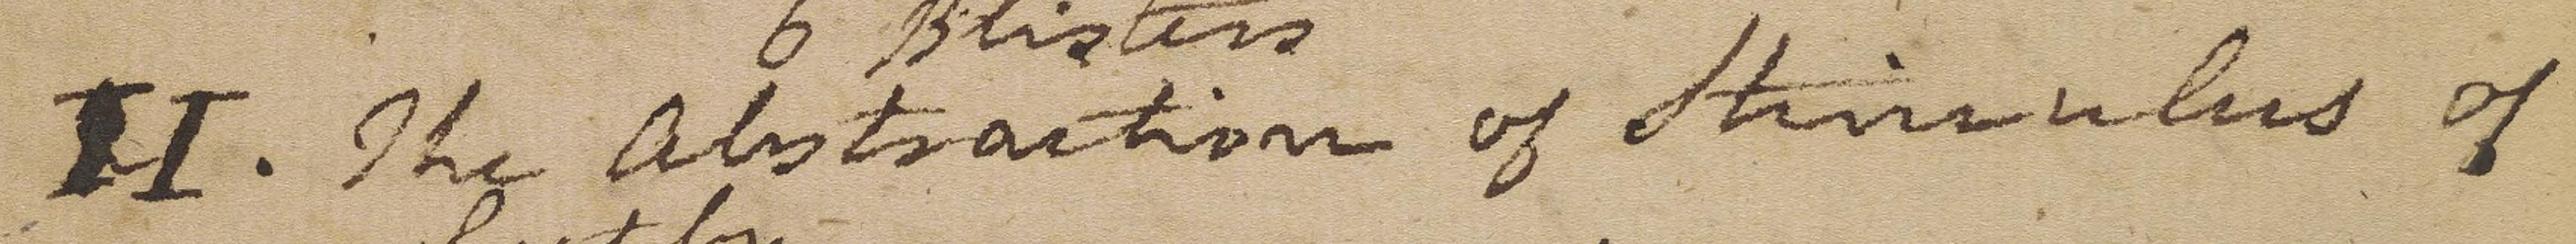II. The Abstraction of Stimulus of
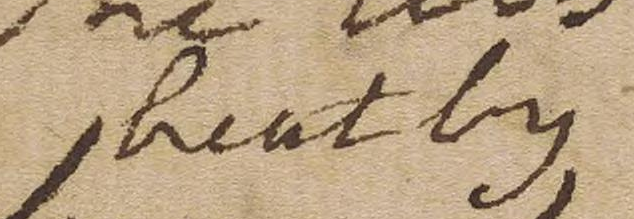heat by
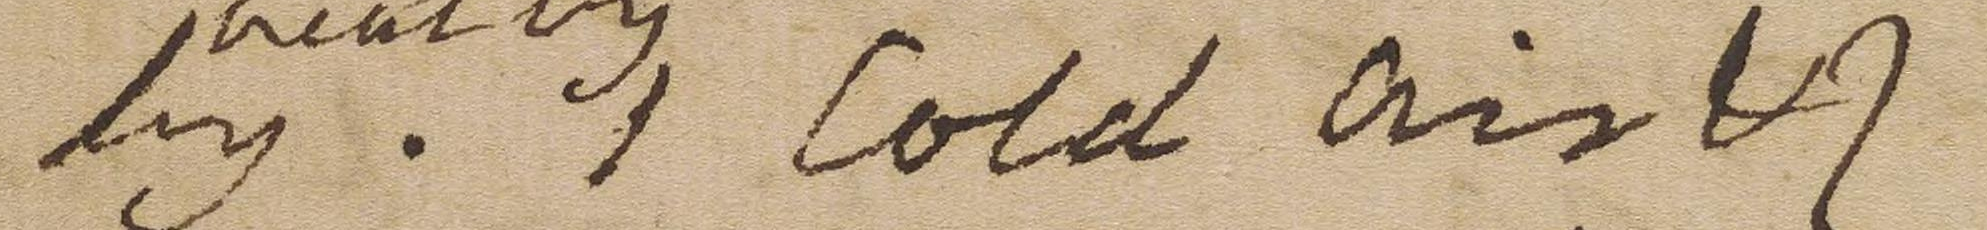by 1 Cold Air &
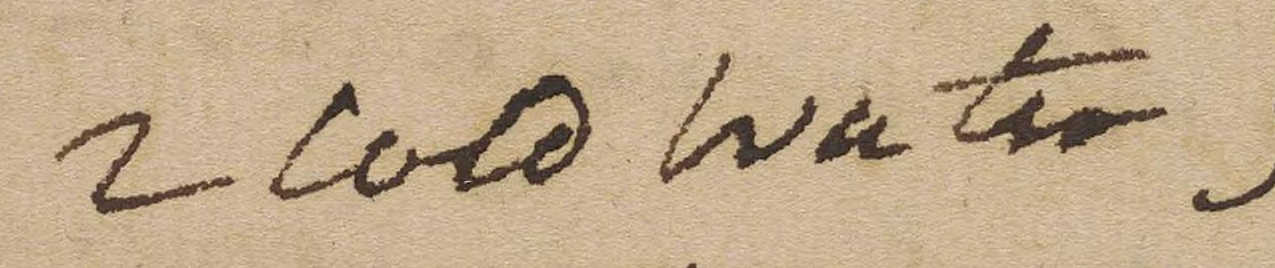2 Cold water
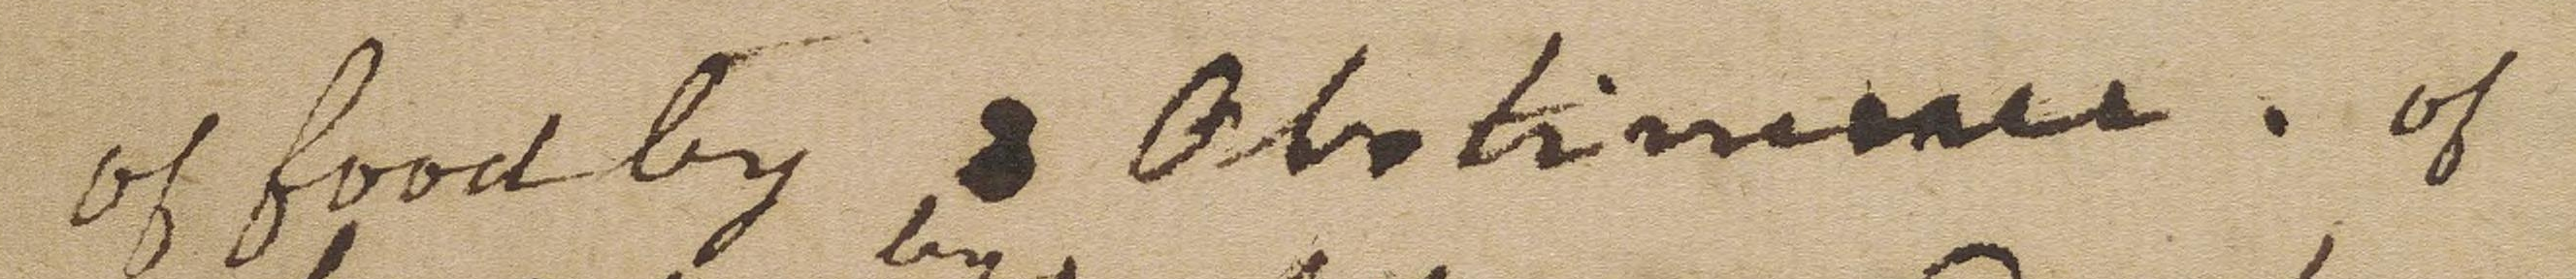of food by 3 Abstinence of
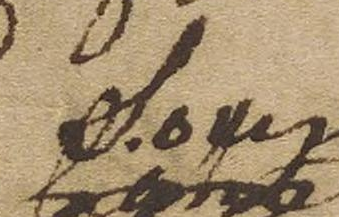Sound
